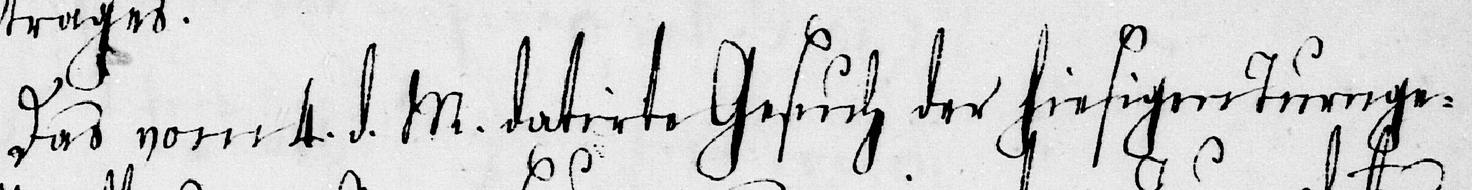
Das vom 4. d. M. datirte Gesuch der hiesigen Turnge¬
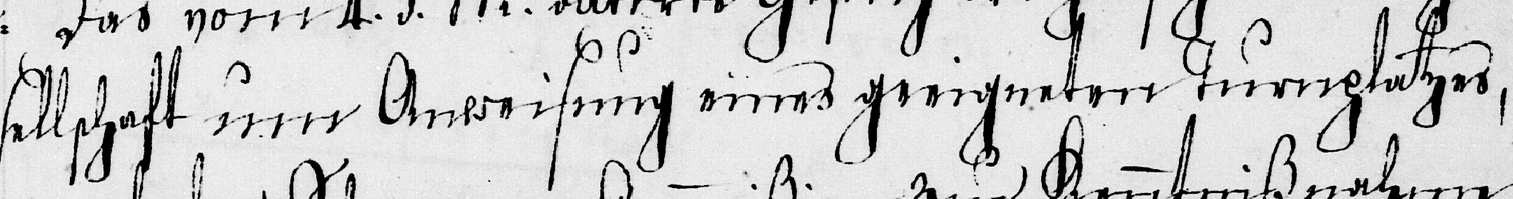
sellschaft um Anweisung eines geeigneten Turnplatzes,
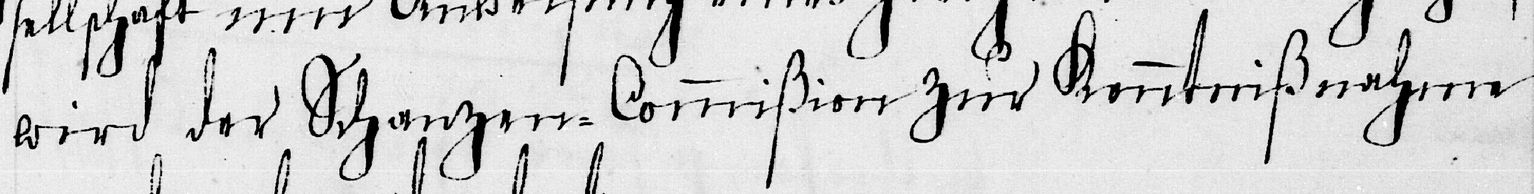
wird der Schanzen-Commißion zur Kenntnißnahme
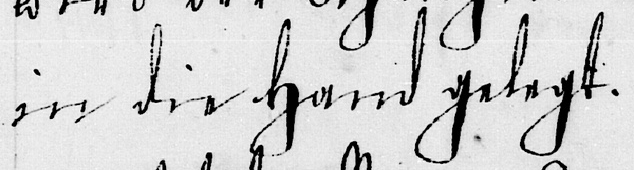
in die Hand gelegt.
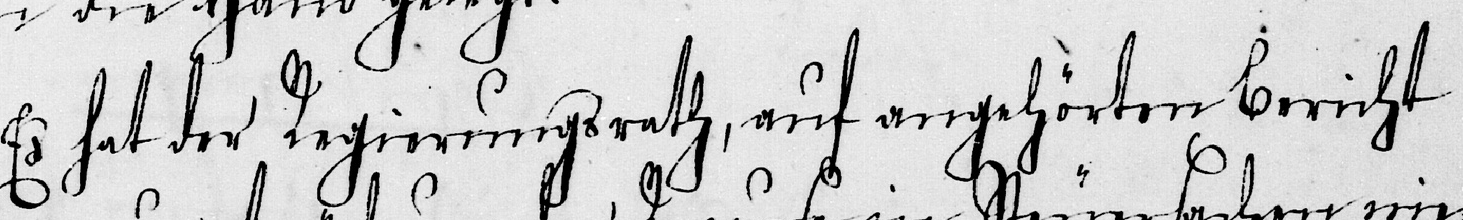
Es hat der Regierungsrath, auf angehörten Bericht
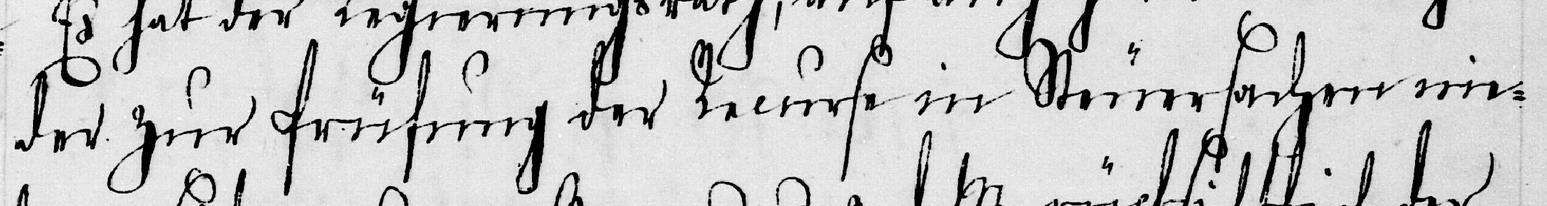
der zur Prüfung der Recurse in Steuersachen nie¬
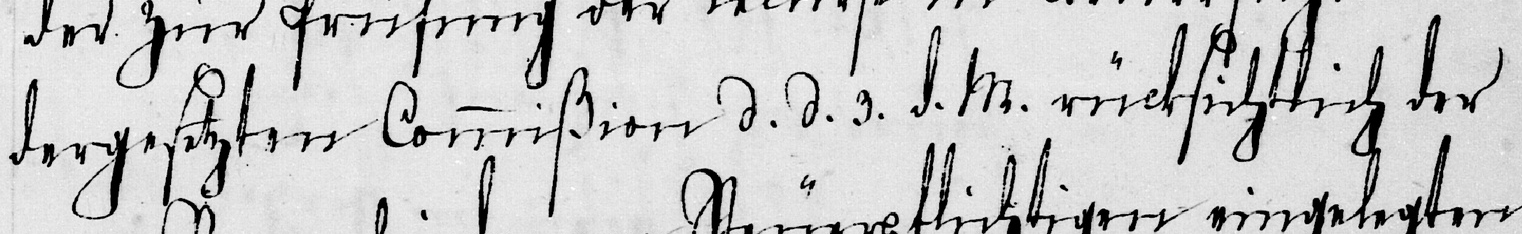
dergesetzten Commißion d. d. 3. d. M. rücksichtlich der
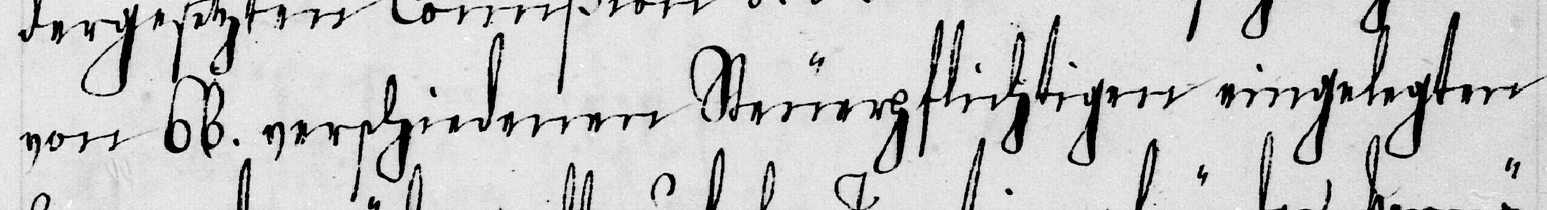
von 66. verschiedenen Steuerpflichtigen eingelegten
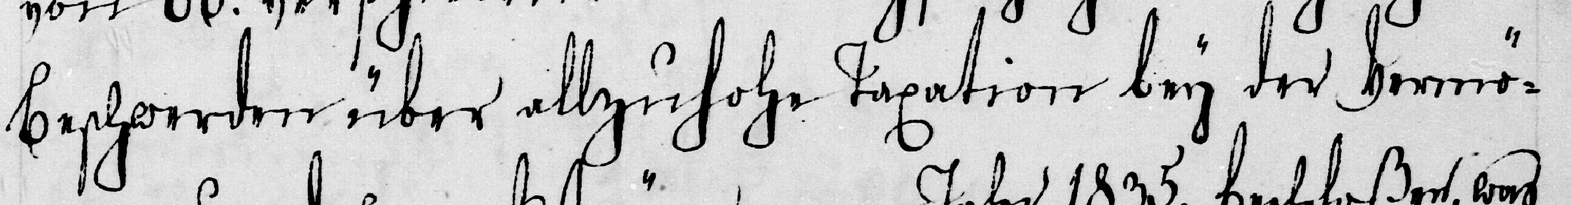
Beschwerden über allzuhohe Taxation bey der Vermö¬
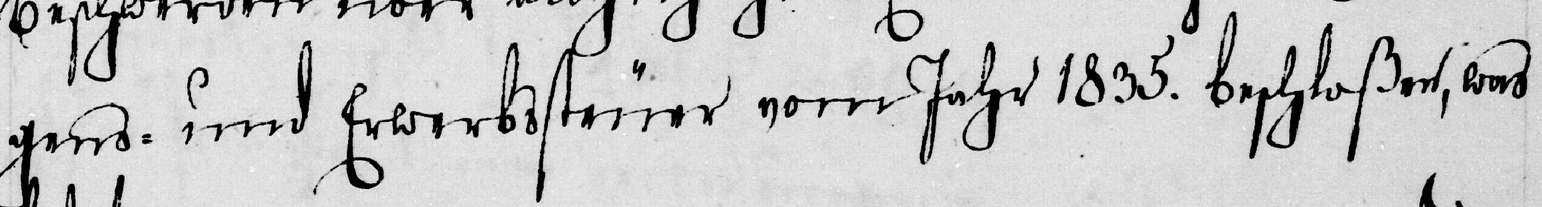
gens- und Erwerbssteuer vom Jahr 1835. beschloßen, was
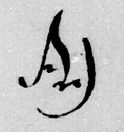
e.)
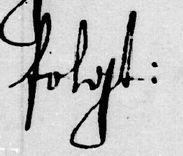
folgt:
